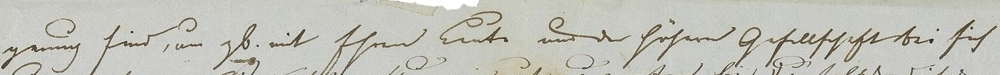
genug sind, um zb. mit Ehren Leute aus der höhern Gesellschaft bei sich
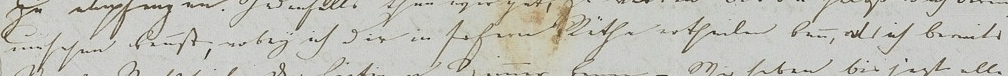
umsehen kannst, wobey ich dir in sofern Räthe ertheilen kann, als ich bereits
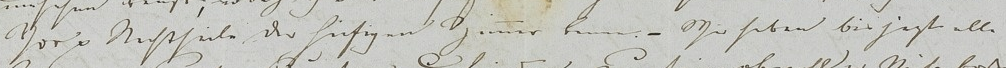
Vor & Nachtheile der hiesigen Zimmer kenne. – Wir haben bis jezt alle
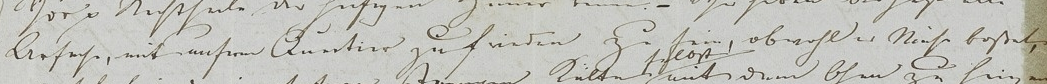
Ursache, mit unserm Quartier zufrieden zu sein, obwohl es Mühe kostet,
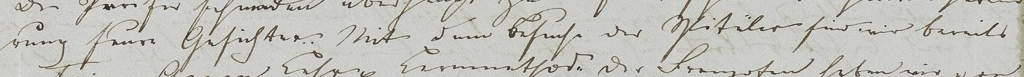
rung saure Gesichter. Mit dem Besuche der Spitäler sind wir bereits
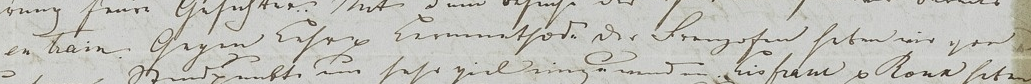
en train. Gegen Lehr & Lernmethode der Franzosen haben wir von
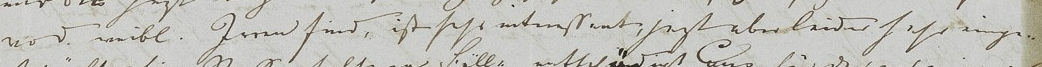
wo d. weibl. Irren sind, ist sehr interessant, jezt aber leider sehr einge-
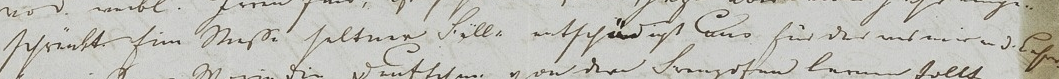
schränkt. Eine Masse seltner Fälle entschädigt uns für das was wir an d. Lehrern
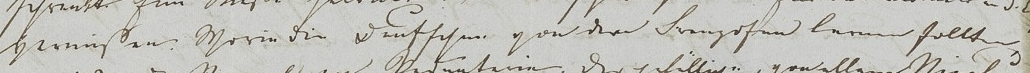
vermissen. Worin die Deutschen von den Franzosen lernen sollten,
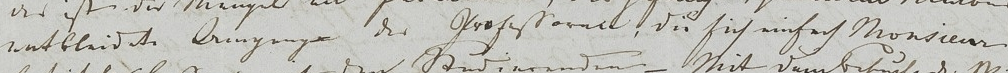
entkleidete Umgange der Professoren, die sich einfach Monsieur
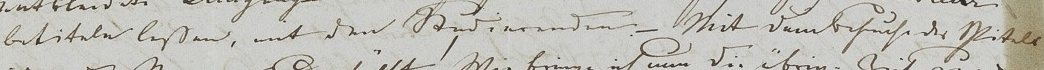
betiteln lassen, mit den Studierenden. – Mit dem Besuche des Spitals
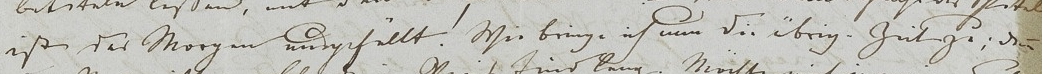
ist der Morgen ausgefüllt! Wie bringe ich nun die übrige Zeit zu; denn
